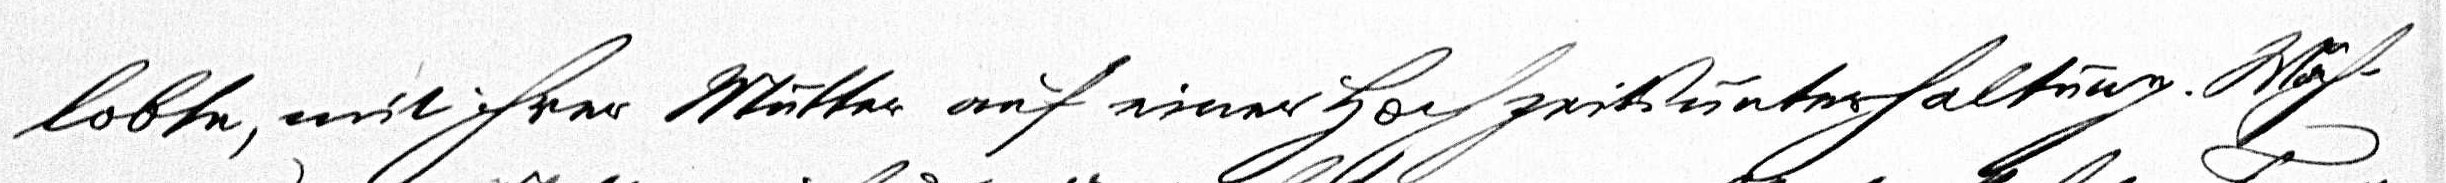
lobte, mit ihrer Mutter auf einer Hochzeitsunterhaltung. Wäh¬
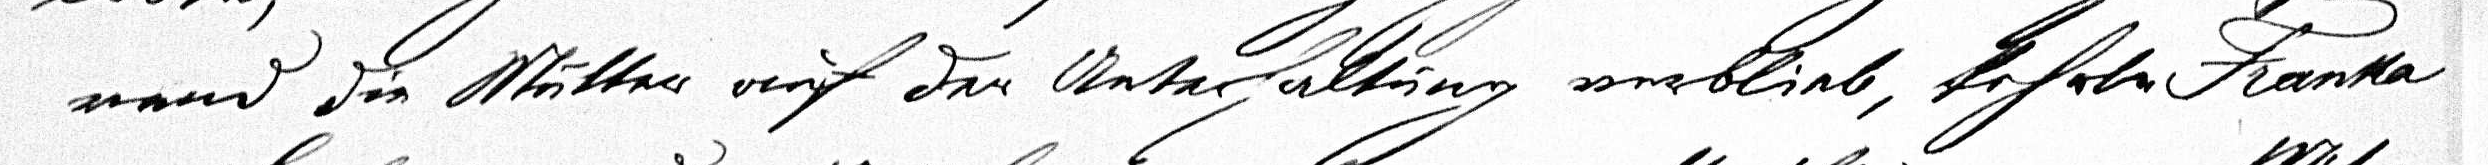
rend die Mutter auf der Unterhaltung verlieb, kehrte Franka
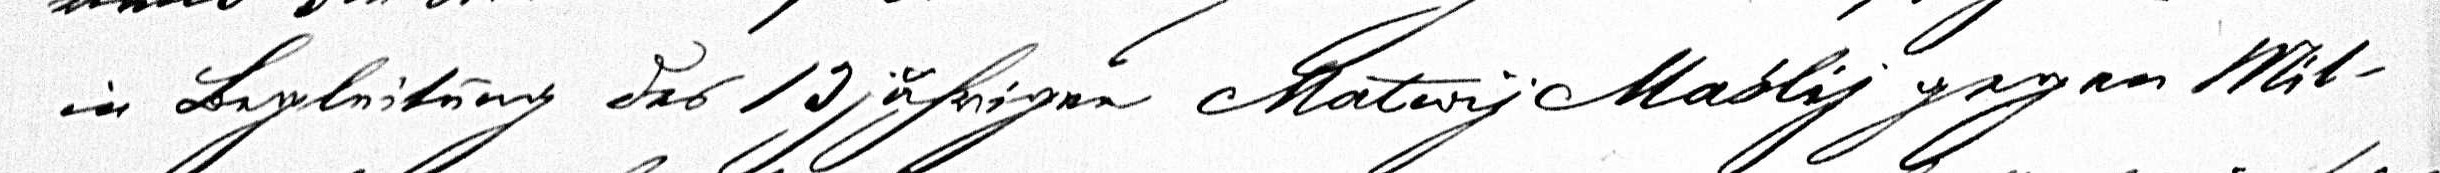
in Begleitung des 13jährigen Matwej Maślij gegen Mit¬
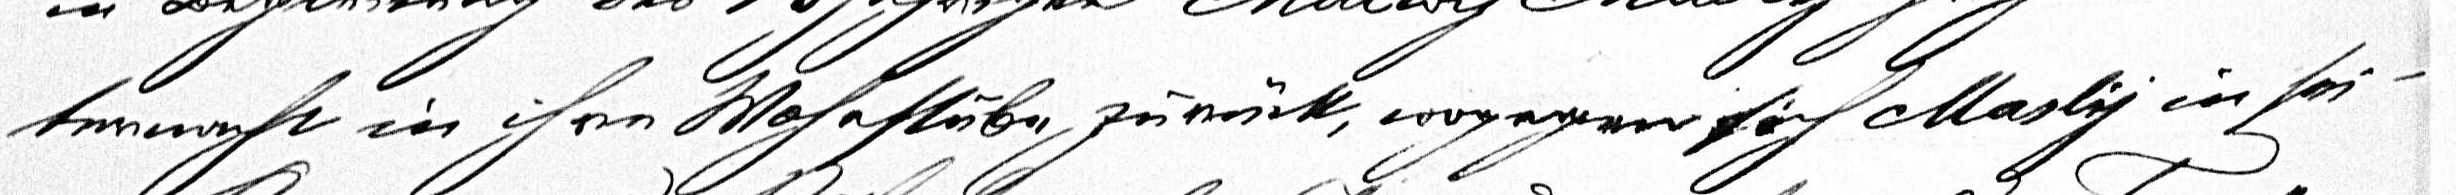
ternacht in ihre Wohnstube zurück, wogegen sich Maslij in sei¬
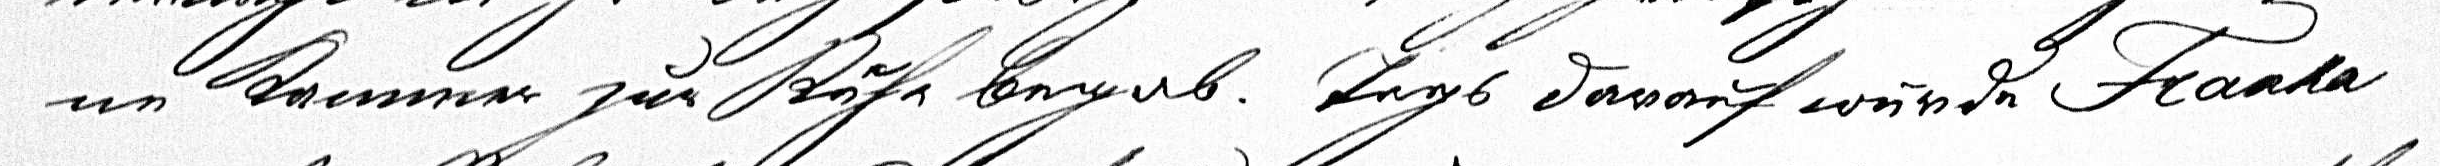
ne Kammer zur Ruhe begab. Tags darauf wurde Franka
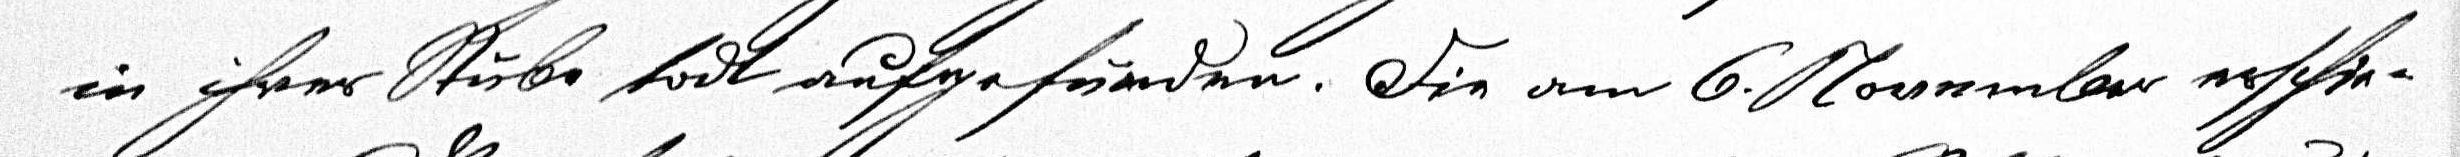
in ihrer Stube todt aufgefunden. Die am 6. November erschie¬
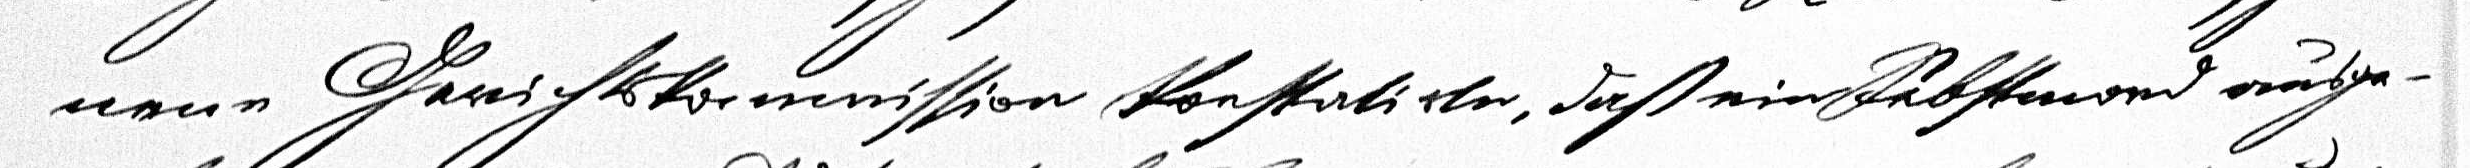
nen Gerichtskommission konstatirte, daß ein Selbstmord ausge¬
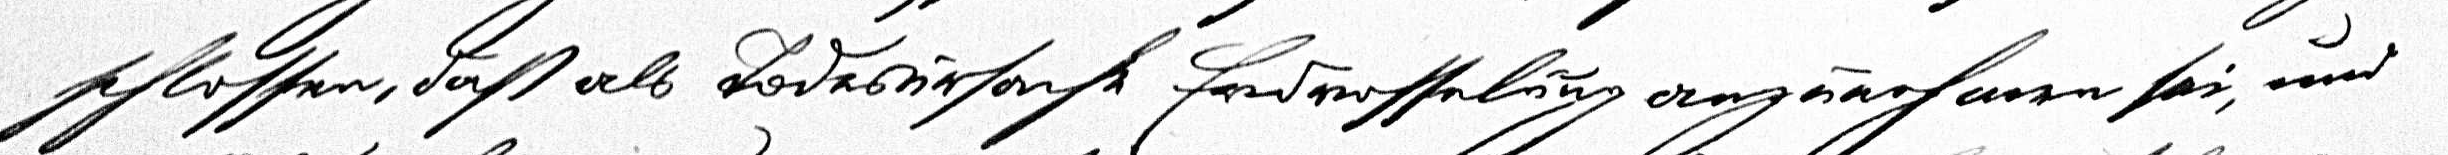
schlossen, daß als Todesursache Erdrosselung anzunehmen sei, und
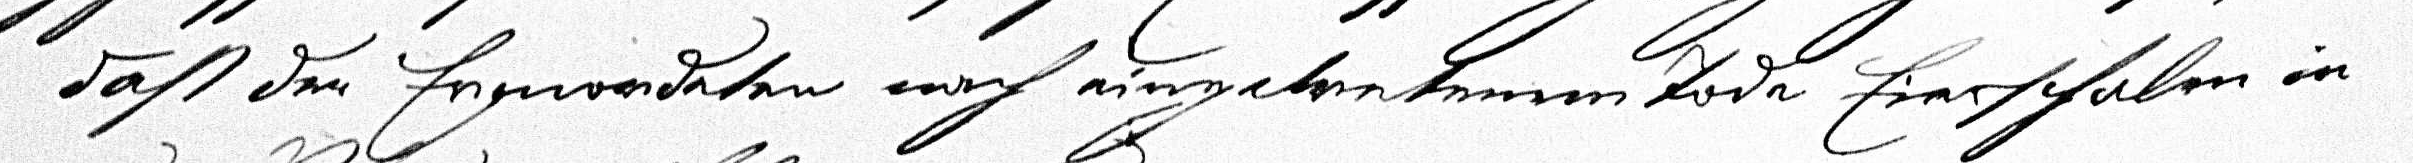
daß der Ermordeten nach eingetretenen Tode Eierschalen in
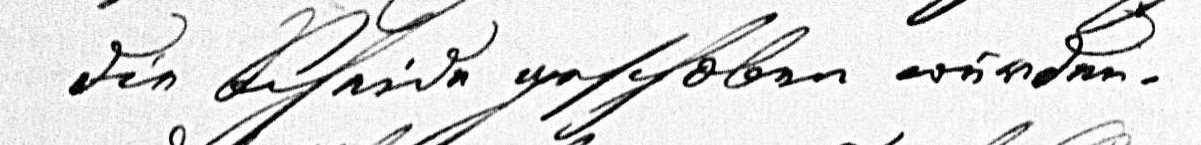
die Scheide geschoben wurden
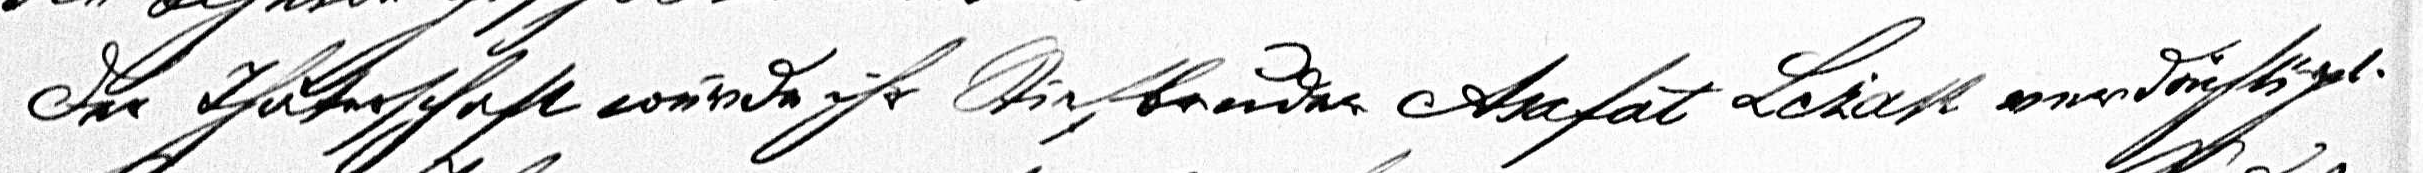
Der Thäterschaft wurde ihr Stiefbruder Asafat Leżak verdächtigt.
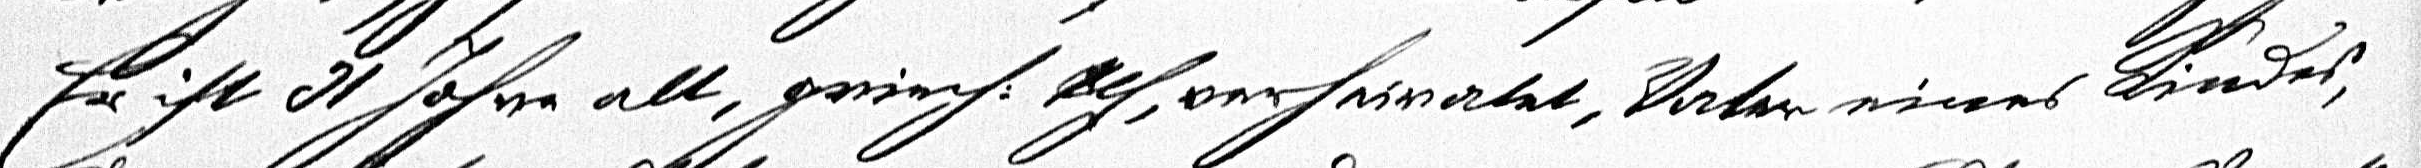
Er ist 31 Jahre alt, griech. Kth., verheiratet, Vater eines Kindes,
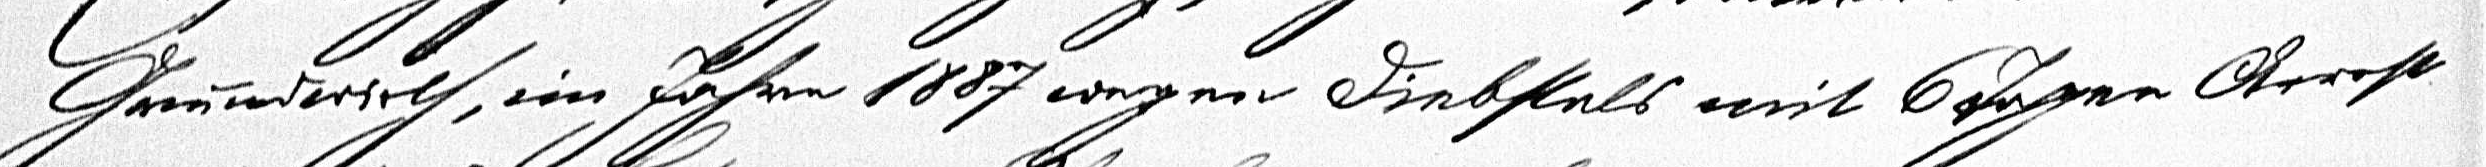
Grundwirth, im Jahre 1887 wegen Diebstals mit 6 Tagen Arrest
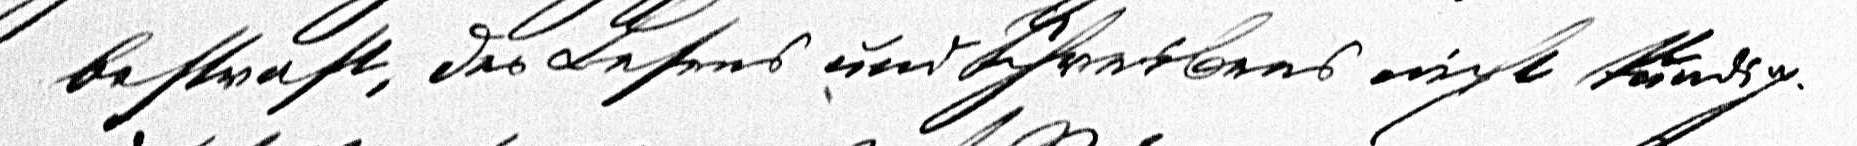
bestraft, des Lesens und Schreibens nicht kündig.
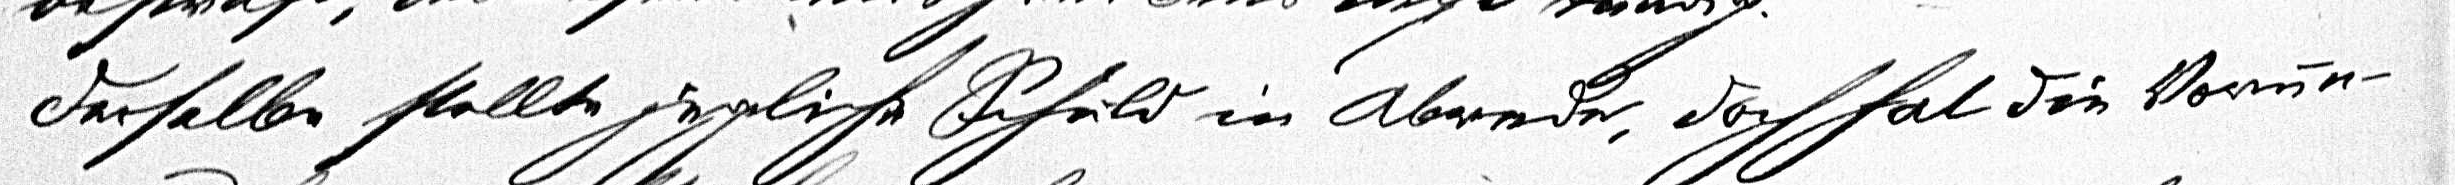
Derselbe stellte jegliche Schuld in Abrede, doch hat die Vorun¬
